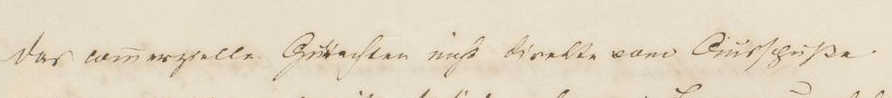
das commerzielle Gutachten nicht dierekte vom Ausschuße
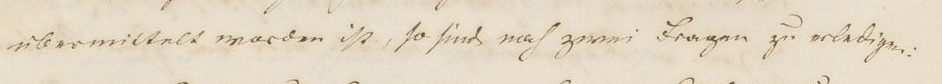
übermittelt worden ist, so sind noch zwei Fragen zu erledigen:
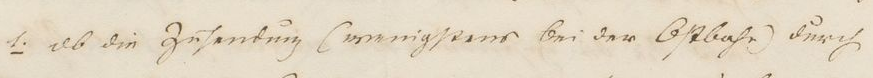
1. ob die Zusendung (wenigstens bei der Ostbahn) durch
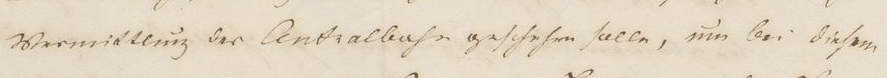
Vermittlung der Centralbahn geschehen soll, um bei diesem
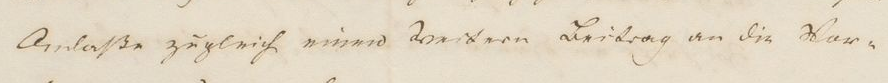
Anlaße zugleich einen weitern Beitrag an die Vor-
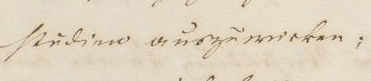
studie auszuwirken;
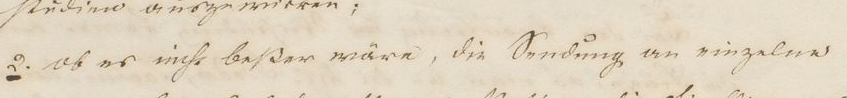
2. ob es nicht beßer wäre, die Sendung an einzelne
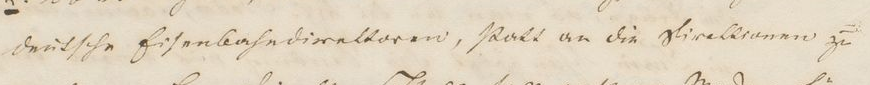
deutsche Eisenbahndirektoren, statt an die Direktionen zu
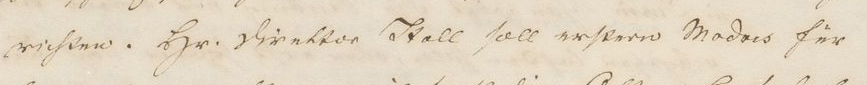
richten. Hr. Direktor Stoll soll erstern Modus für
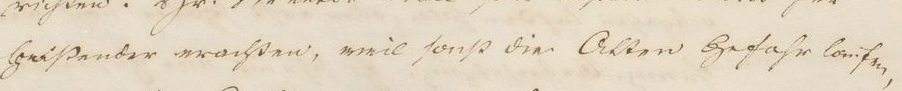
paßender erachten, weil sonst die Akten Gefahr laufen,
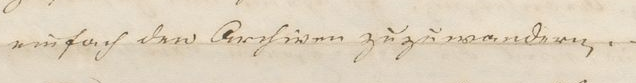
einfach den Archiven zuzuwandern. –
